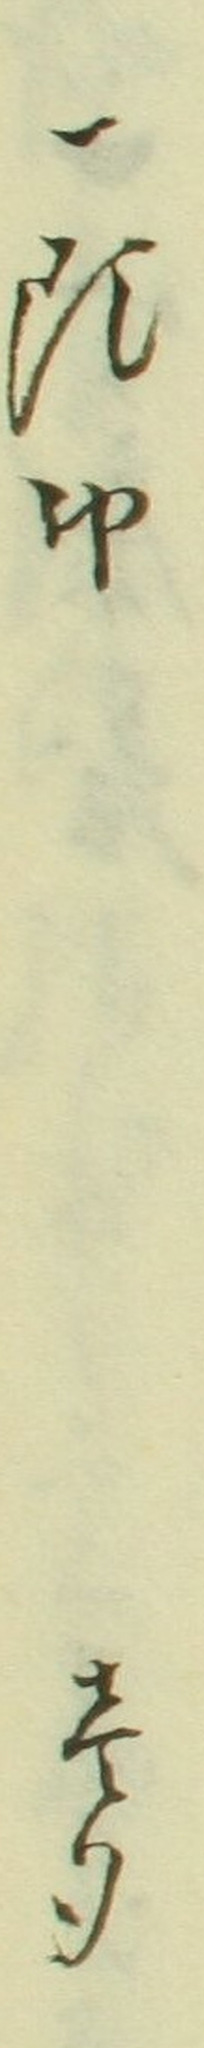一頭巾壱ツ

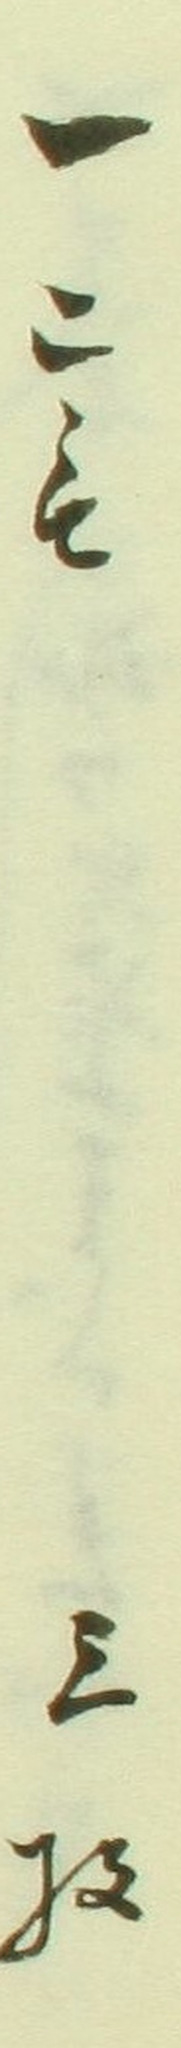一こも三枚
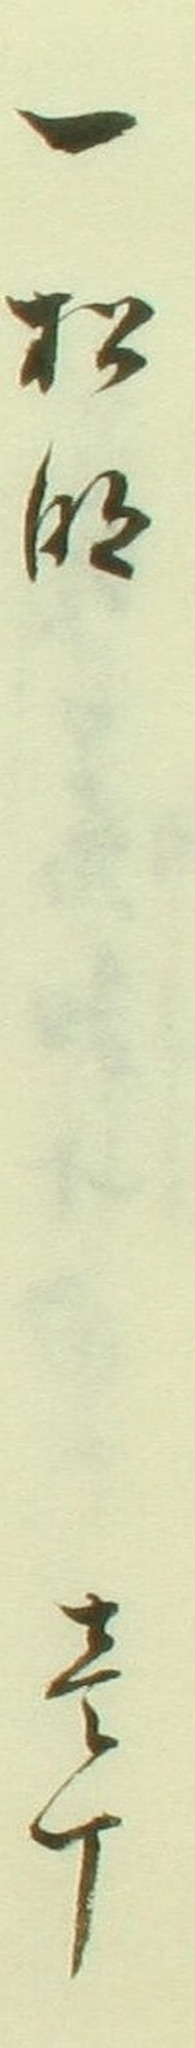一松明壱丁
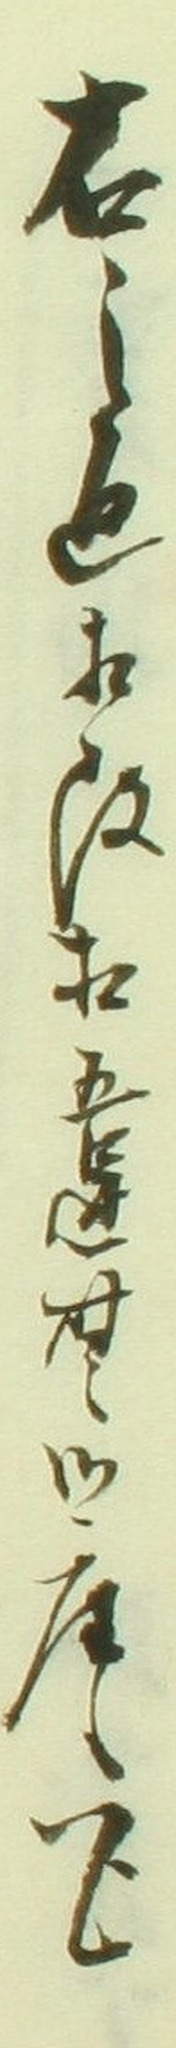右之通相改相違無御座候以上
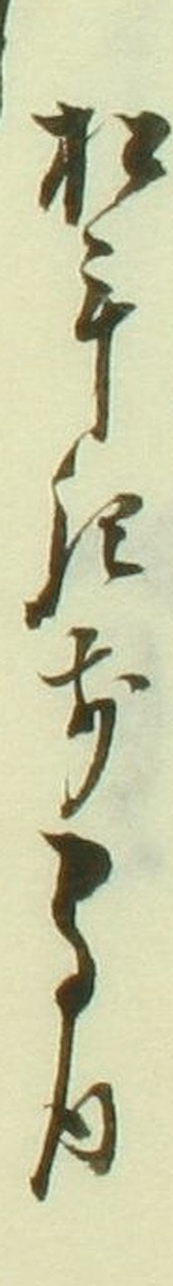松平肥前守内
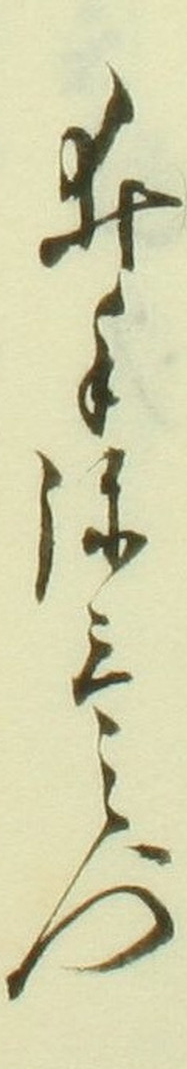井手弥三右衛門
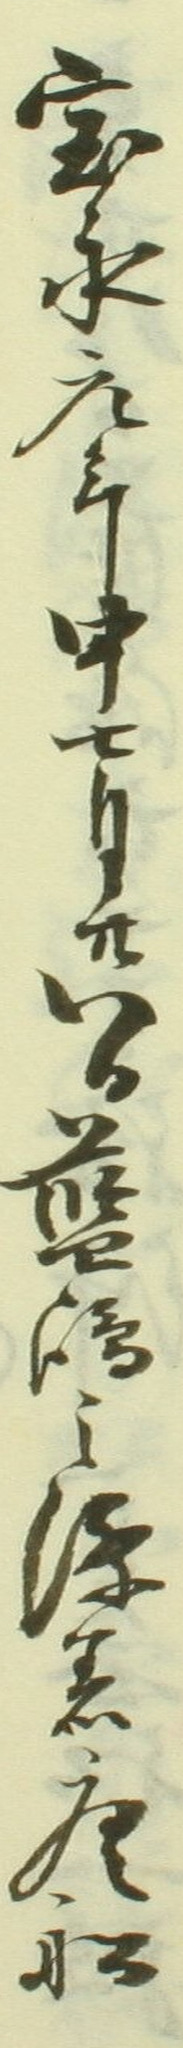宝永元年申七月廿八日藍嶋之漂着唐船
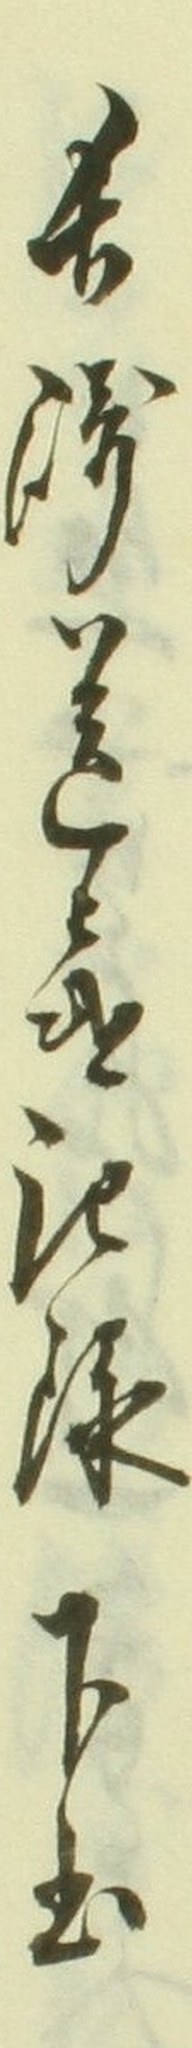長崎送被遣記録下書
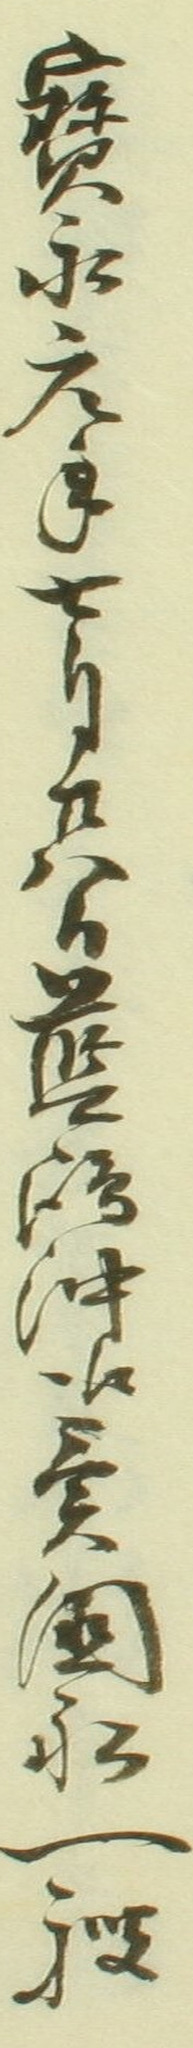宝永元年七月廿八日藍嶋沖江異国船一艘
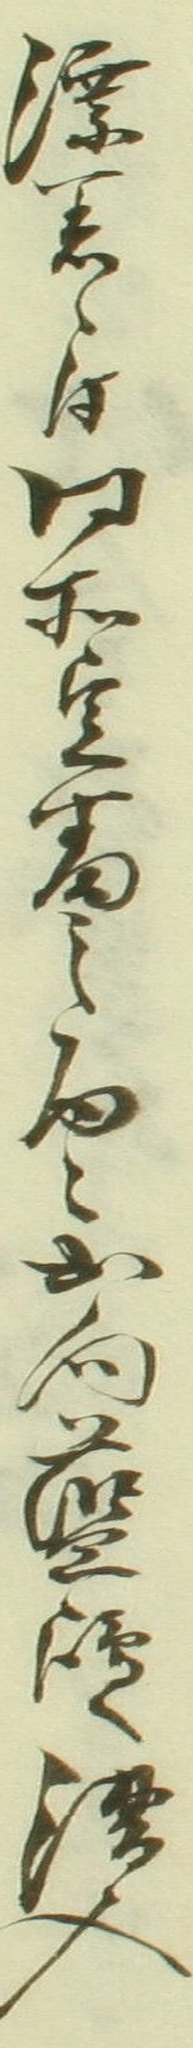漂着ニ付同所定番之面々出向藍嶋へ漕入
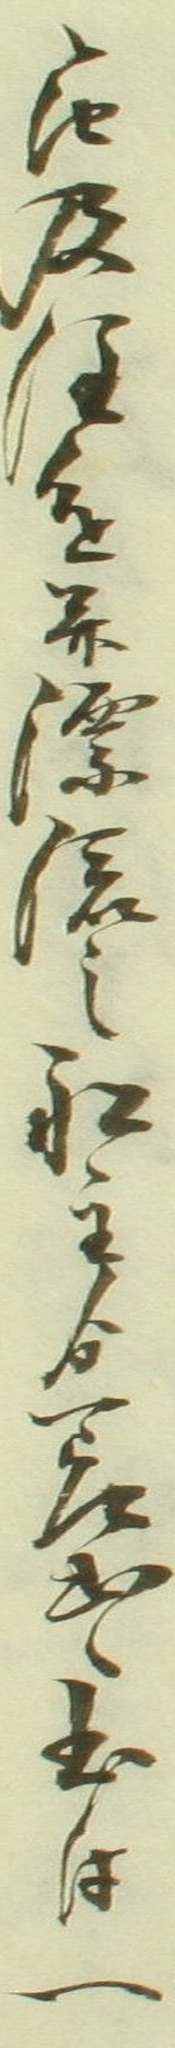候由及注進并漂流之船主ゟ差出候書付一
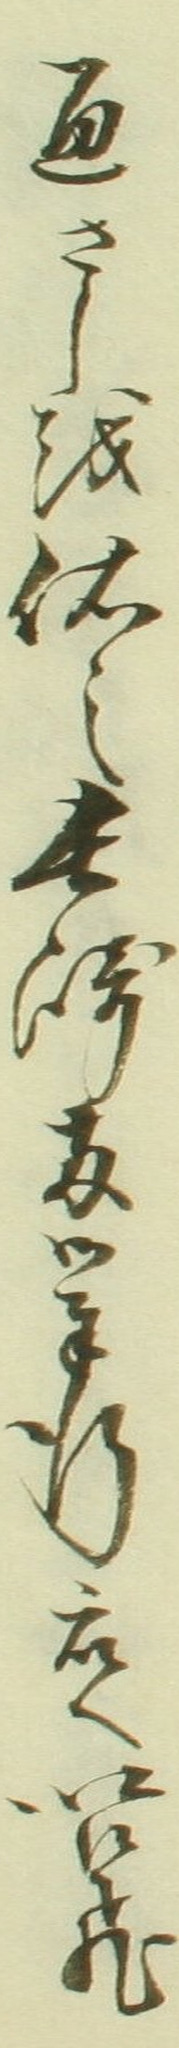通さし越依之長崎両奉行衆へ以御飛
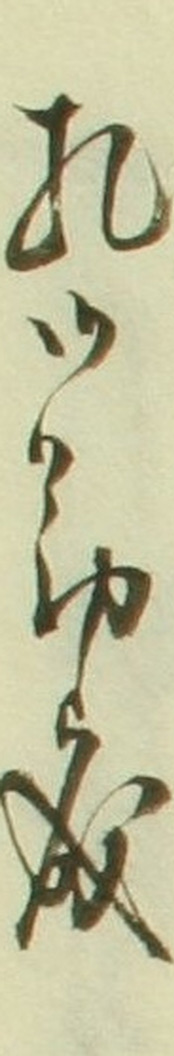札御勤被成
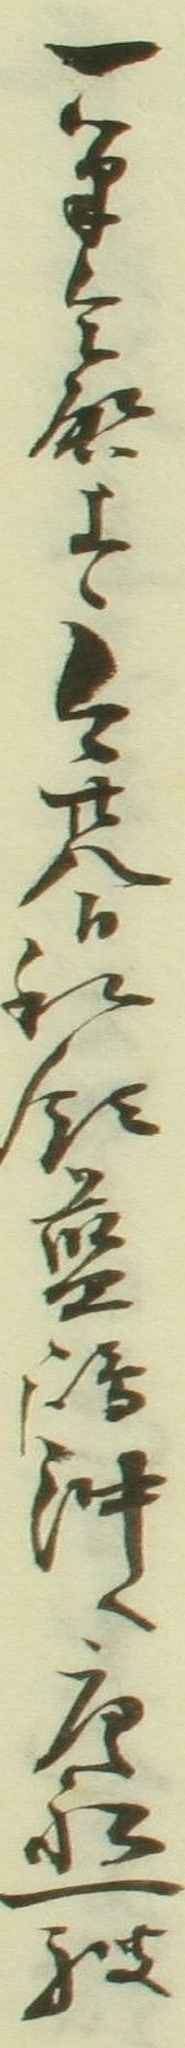一筆令啓上候今廿八日私領藍嶋沖へ唐船一艘
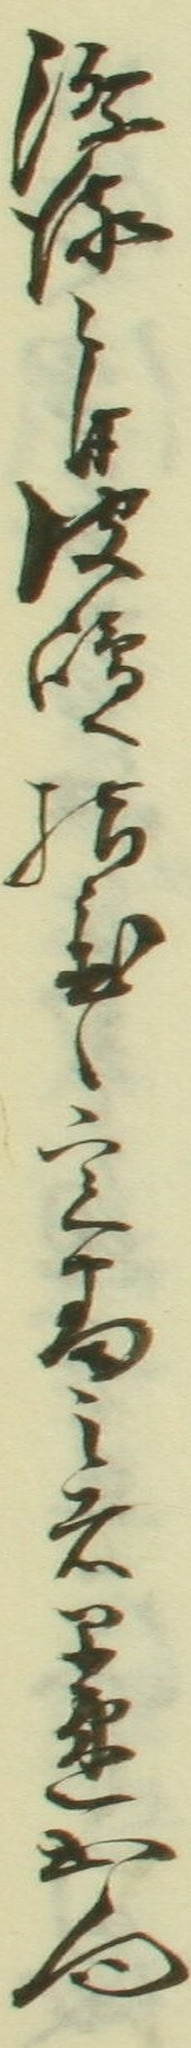漂流ニ付波嶋へ指置候定番之者早速出向

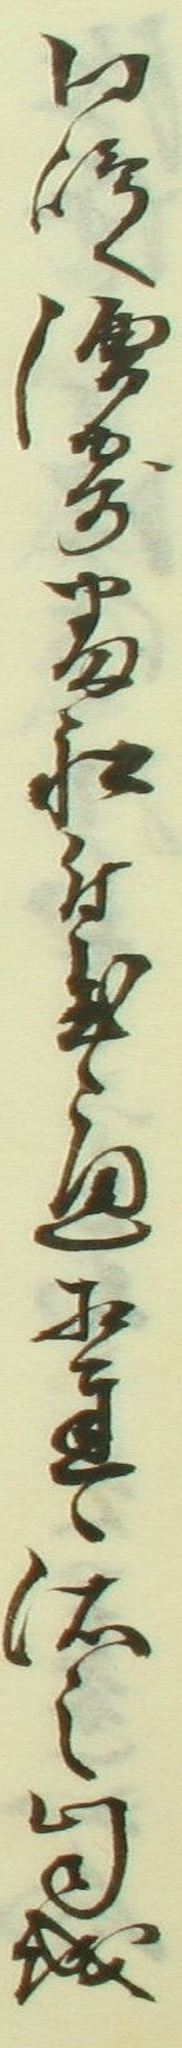同嶋へ漕寄番船付置候通相達候依之自城
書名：異国船漂着記
